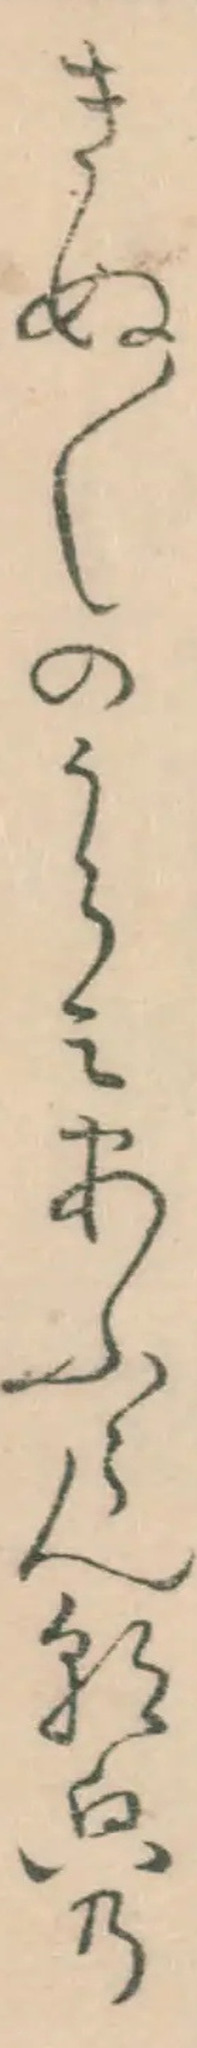きぬ〳〵のうらみあふらん朝皃の
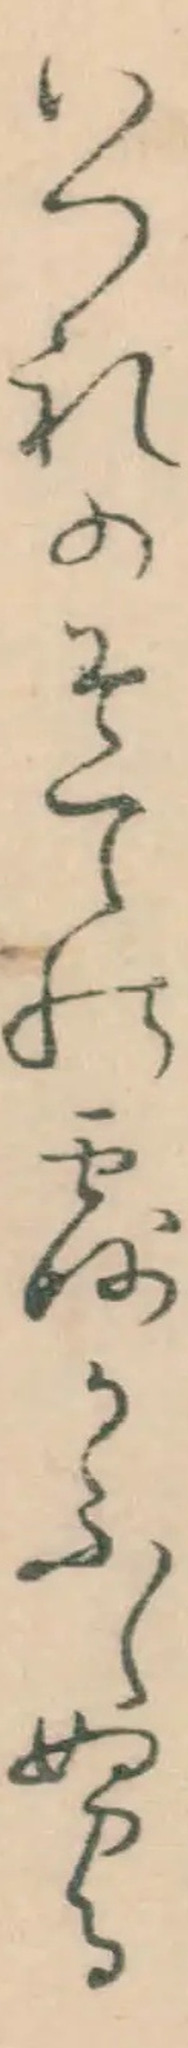いつれのそての露かふぬる廣海

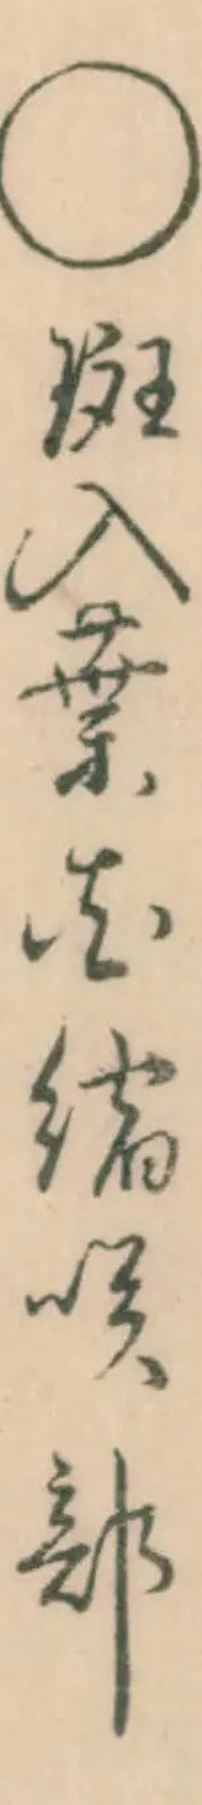○斑入葉花縮咲部
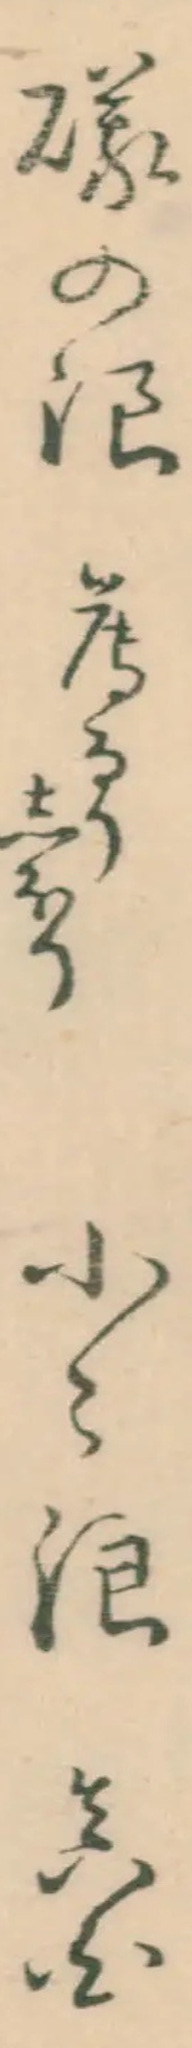礒の浪薄るりしほり小々浪真花
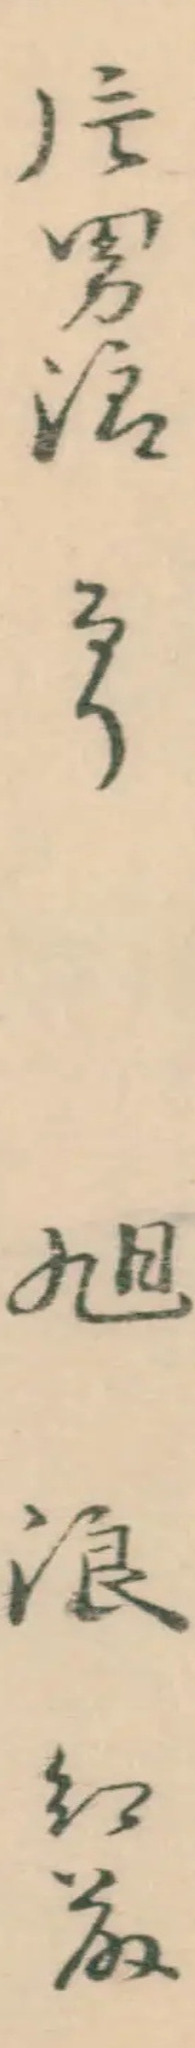片男浪るり旭浪紅藤
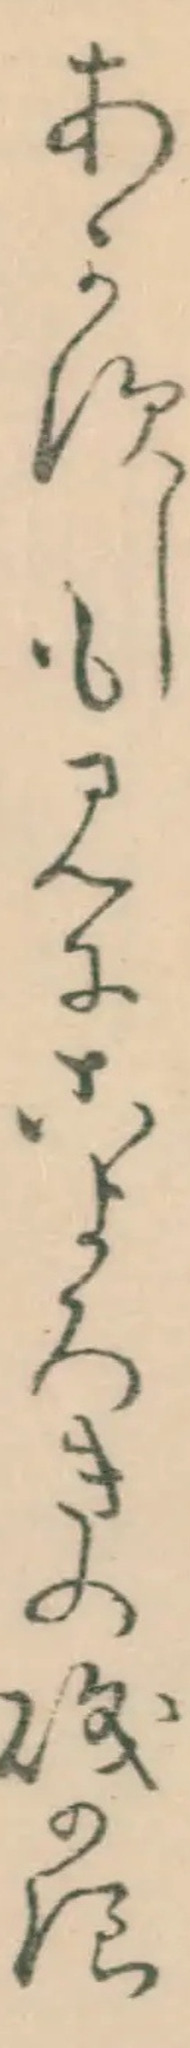あかすしも見にこよろきの磯の浪
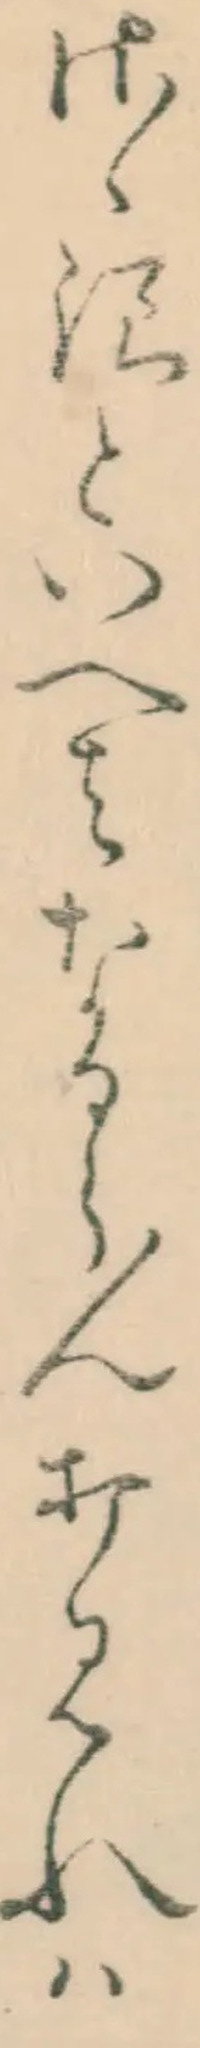さゝ浪といへはなるらん打見れは
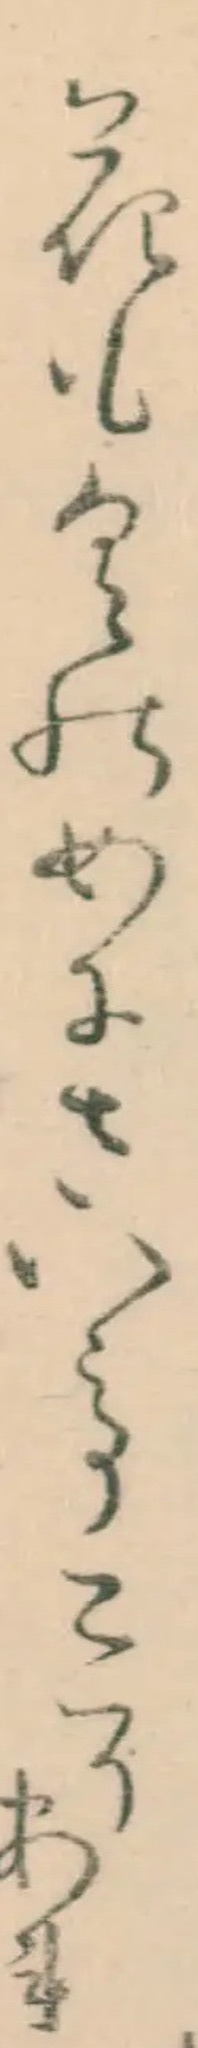花もくのめにさいてこそあれ桃丸
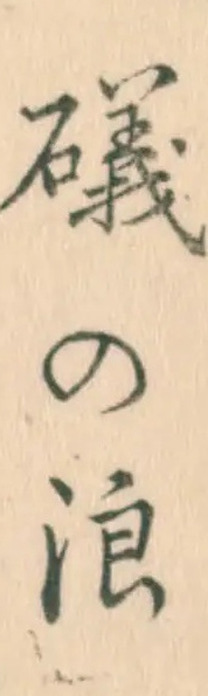礒の浪

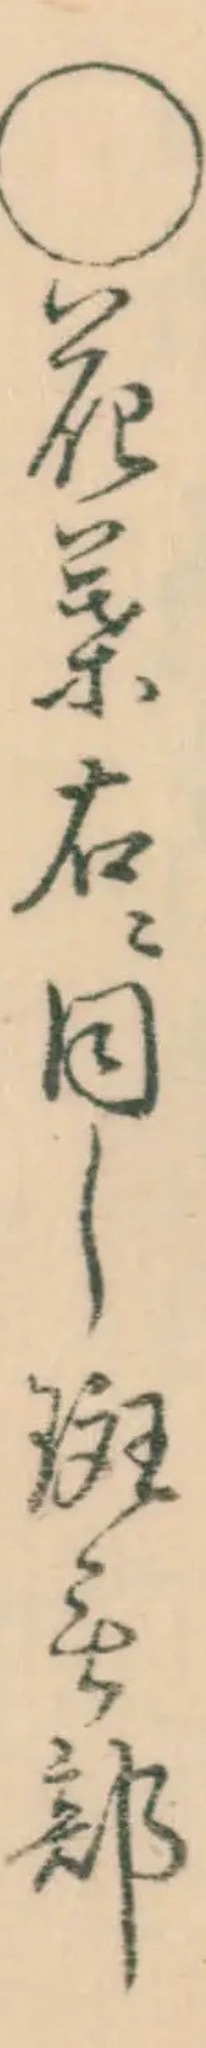○花葉右に同し斑無部
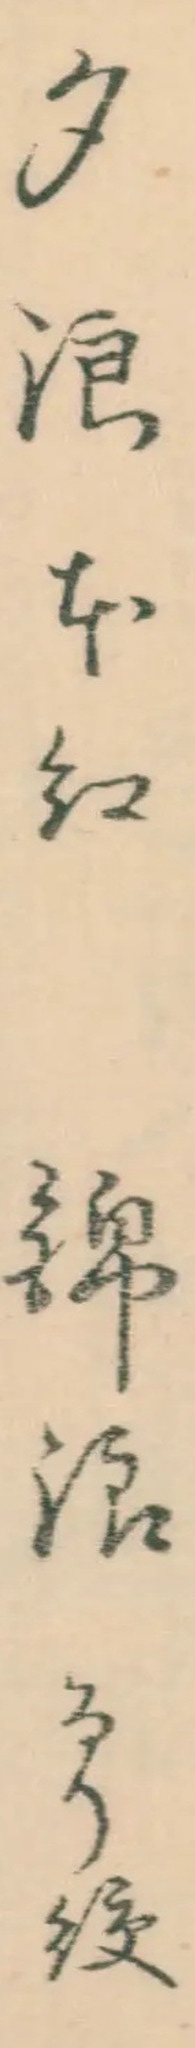夕浪本紅錦浪るり絞

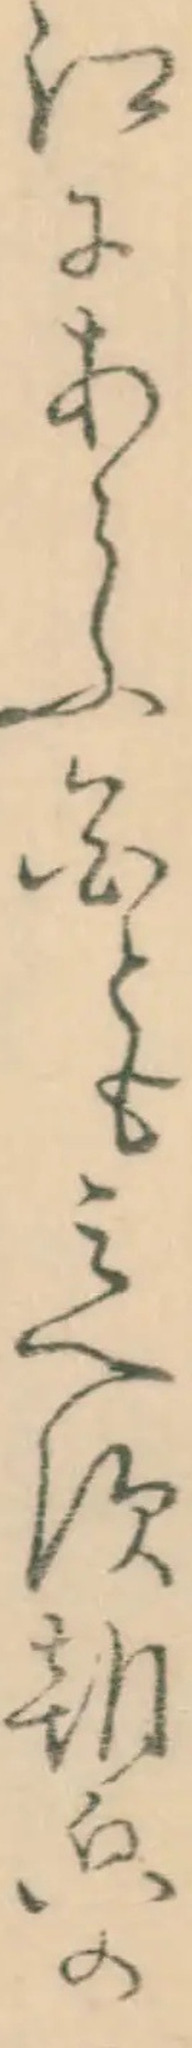紅にあらふ花ともみへす朝皃の
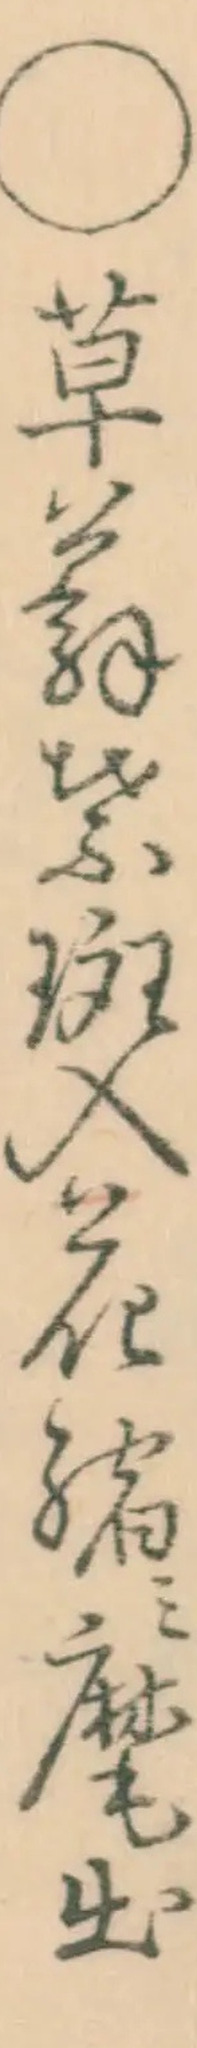○草舞葉斑入花縮み麾出
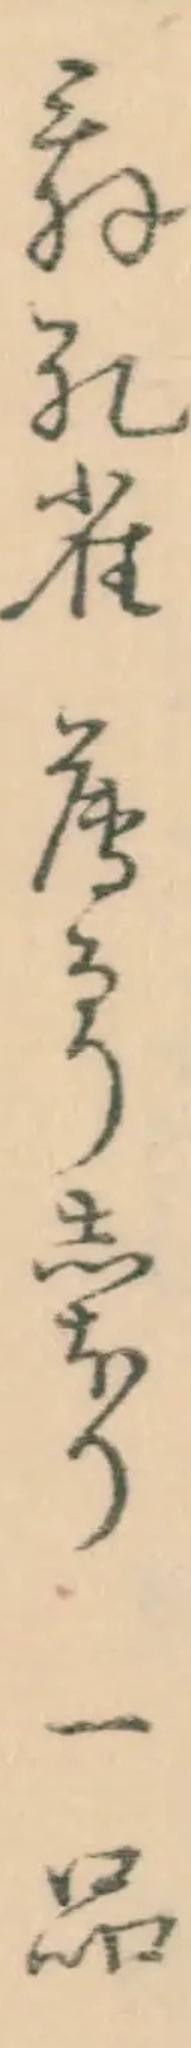舞孔雀薄るりしほり一品
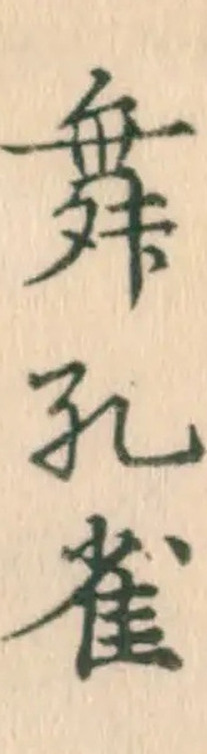舞孔雀

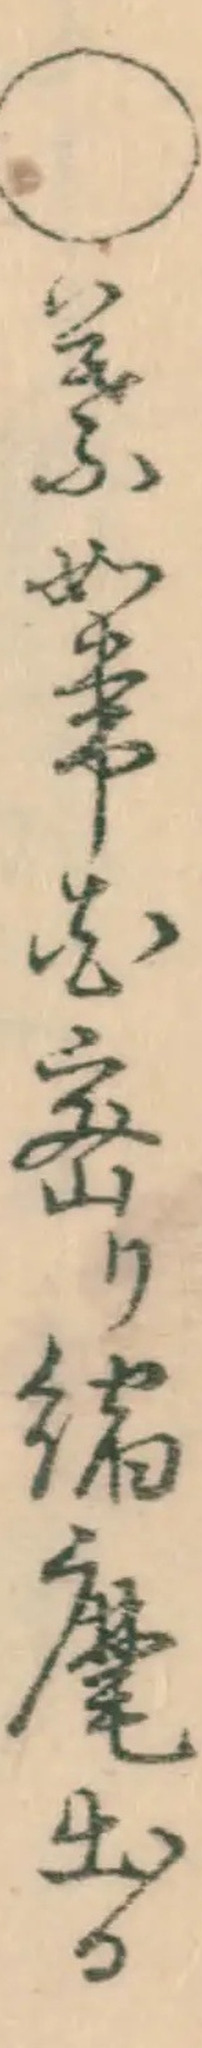○葉如常花密り縮麾出る
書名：花壇朝顔通 2巻. [1]
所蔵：国立国会図書館 National Diet Library, JAPAN
